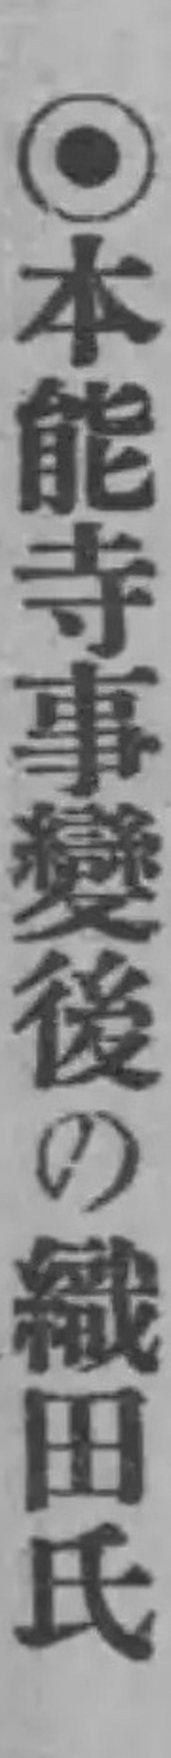⦿本能寺事変後の織田氏

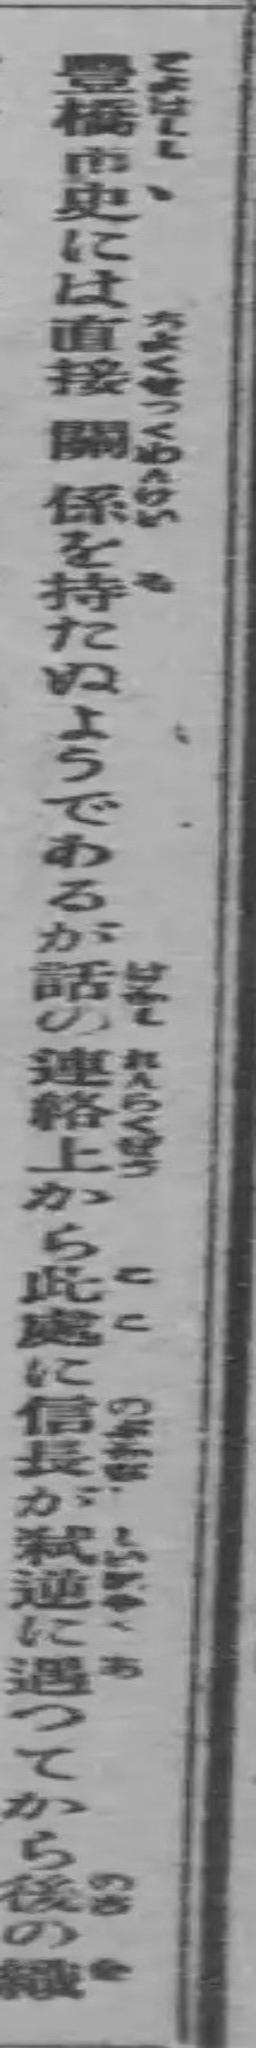豊橋市史には直接関係を持たぬようであるが話の連絡上から此処に信長が弑逆に遇つてから後の織
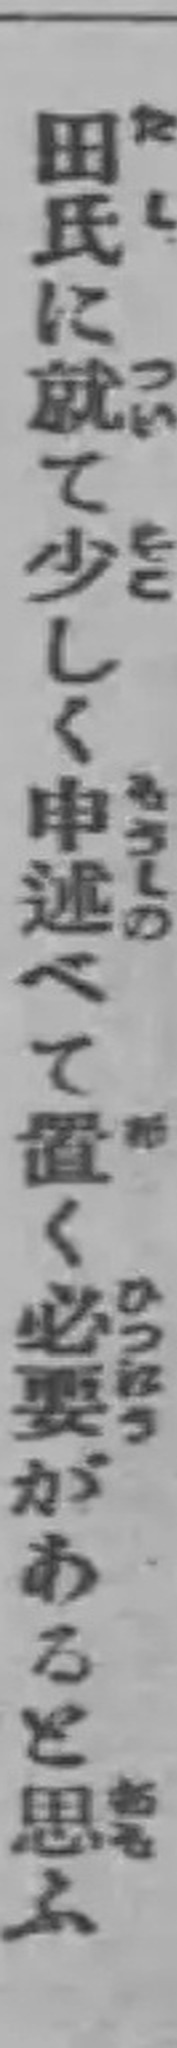田氏に就て少しく申述べて置く必要があると思ふ
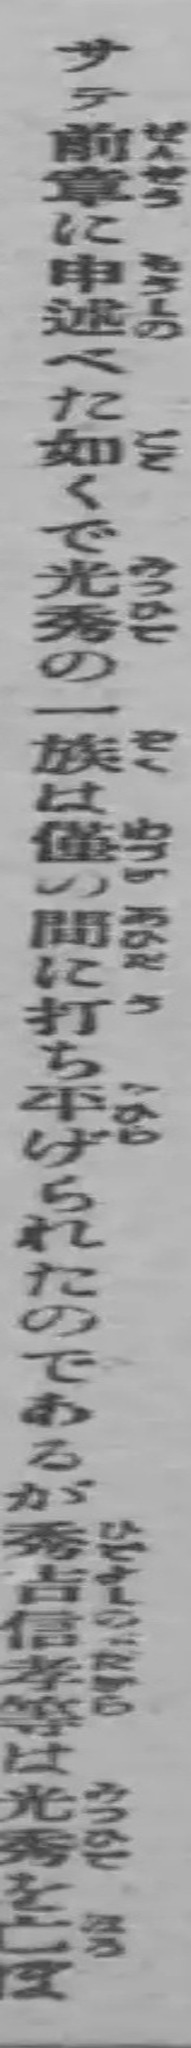サテ前章に申述べた如くで光秀の一族は僅の間に打ち平げられたのであるが秀吉信孝等は光秀を亡ぼ
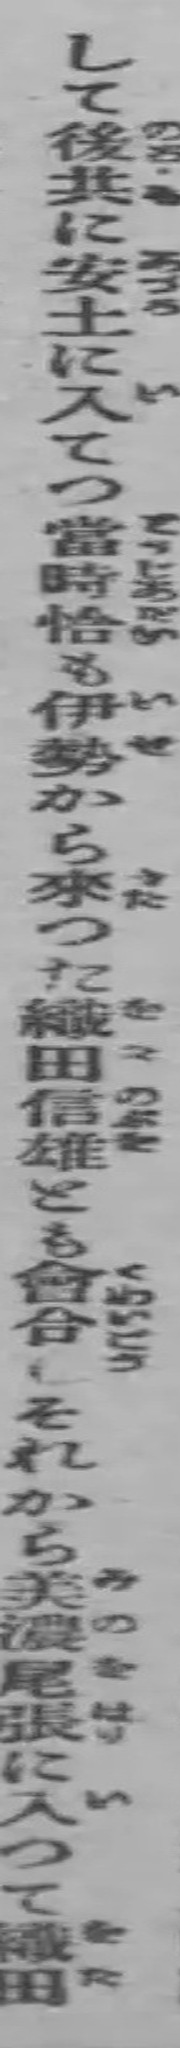して後共に安土に入つて当時恰も伊勢から来つた織田信雄とも会合しそれから美濃尾張に入つて織田
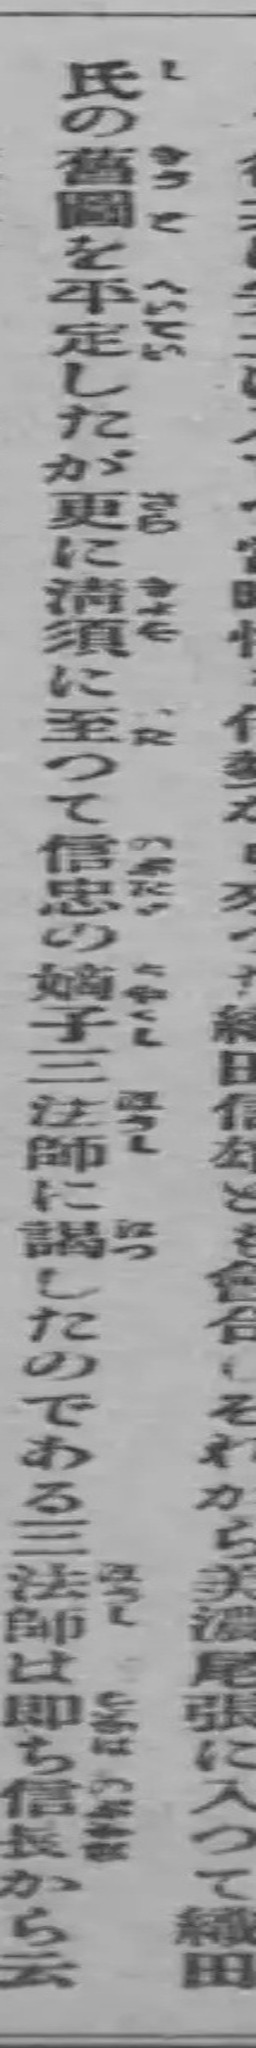氏の旧国を平定したが更に清須に至つて信忠の嫡子三法師に謁したのである三法師は即ち信長から云
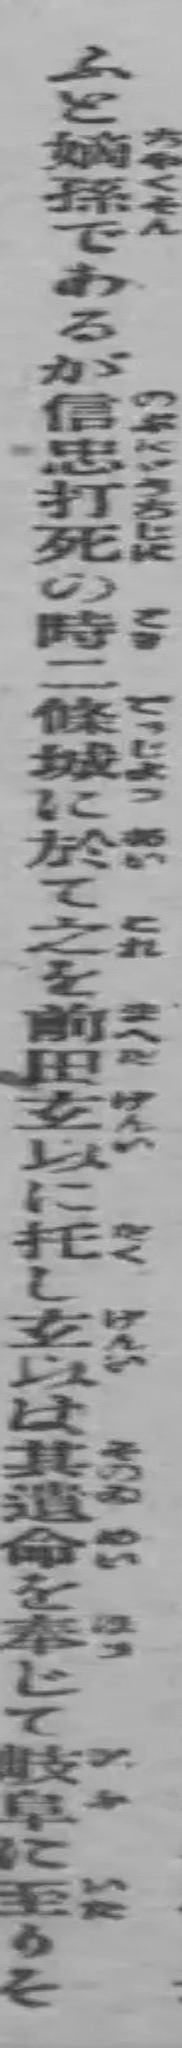ふと嫡孫であるが信忠打死の時二条城に於て之を前田玄以に托し玄以は其遺命を奉じて岐阜に至りそ
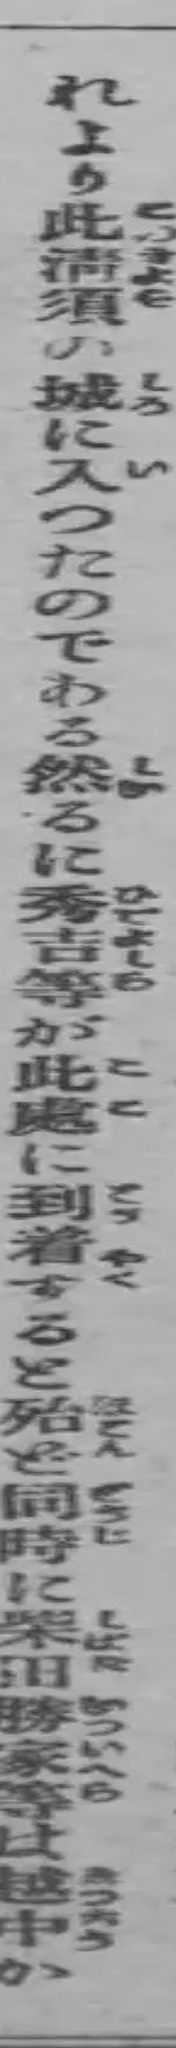清須会議れより此清須の城に入つたのである然るに秀吉等が此処に到着すると殆ど同時に柴田勝家等は越中か
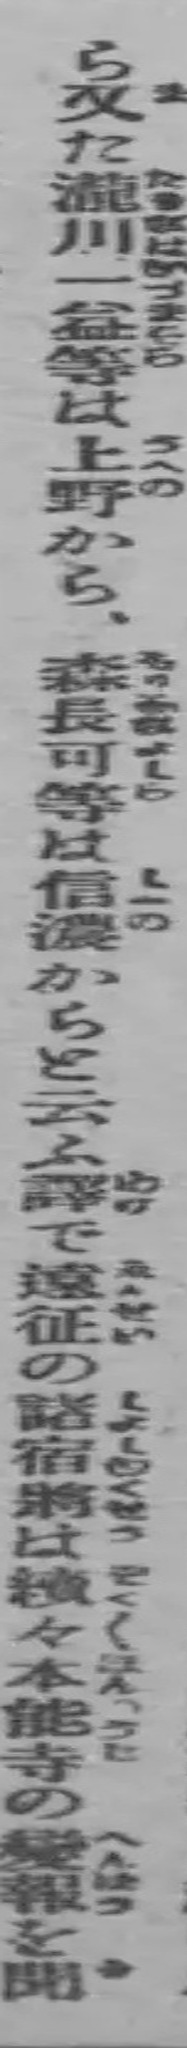ら又た瀧川一益等は上野から、森長可等は信濃からと云ふ訳で遠征の諸宿将は続々本能寺の変報を聞
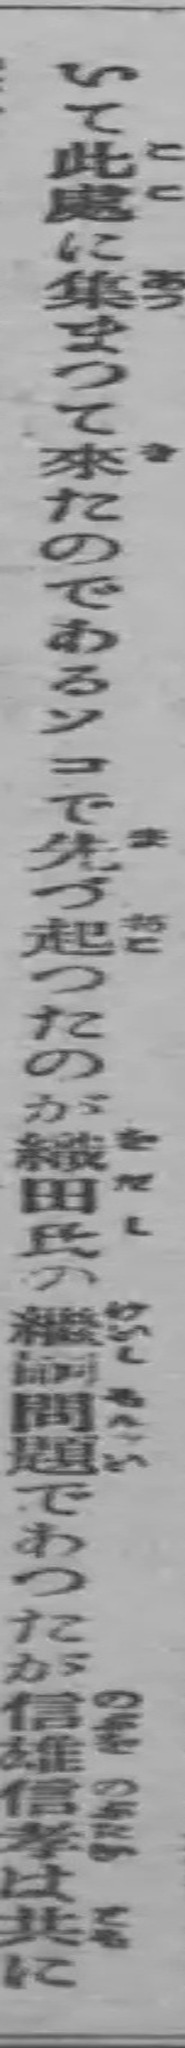いて此処に集まつて来たのであるソコで先づ起つたのが織田氏の継嗣問題であつたが信雄信孝は共に
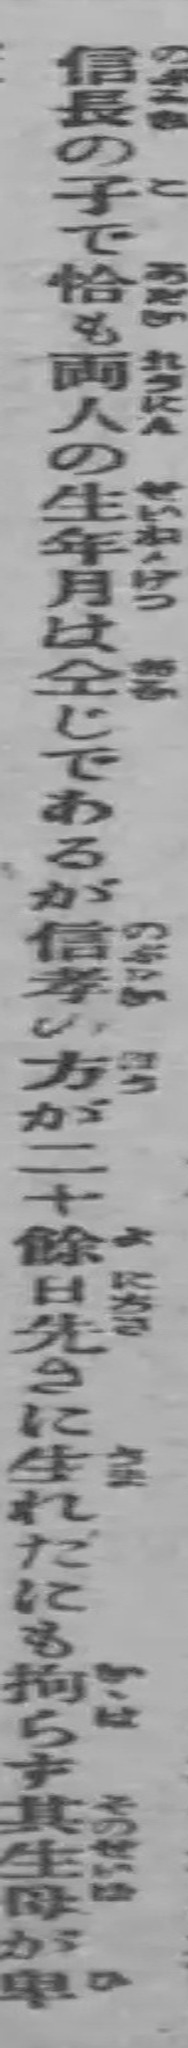信雄と信孝信長の子で恰も両人の生年月は仝じであるが信孝の方が二十余日先きに生れたにも拘らず其生母が卑
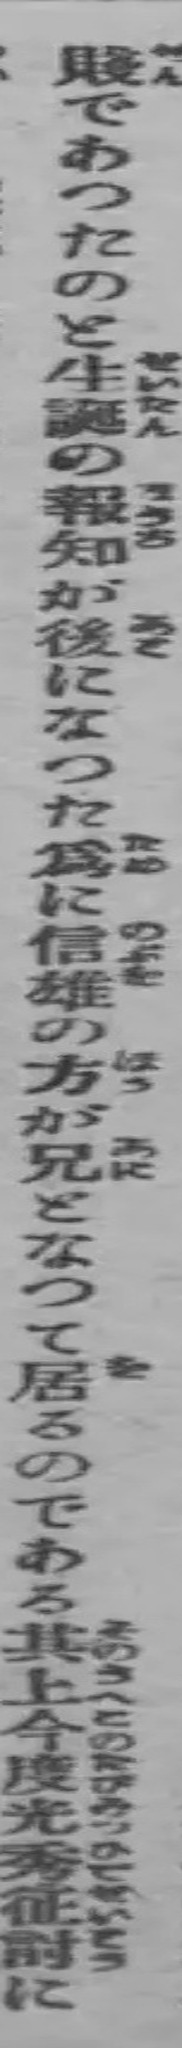賎であつたのと生誕の報知が後になつた為に信雄の方が兄となつて居るのである其上今度光秀征討に
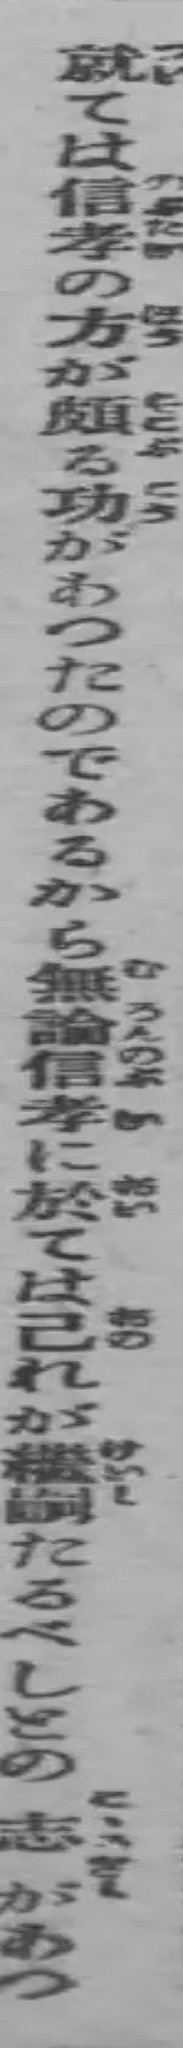就ては信孝の方が頗る功があつたのであるから無論信孝に於ては己れが継嗣たるべしとの志があつ
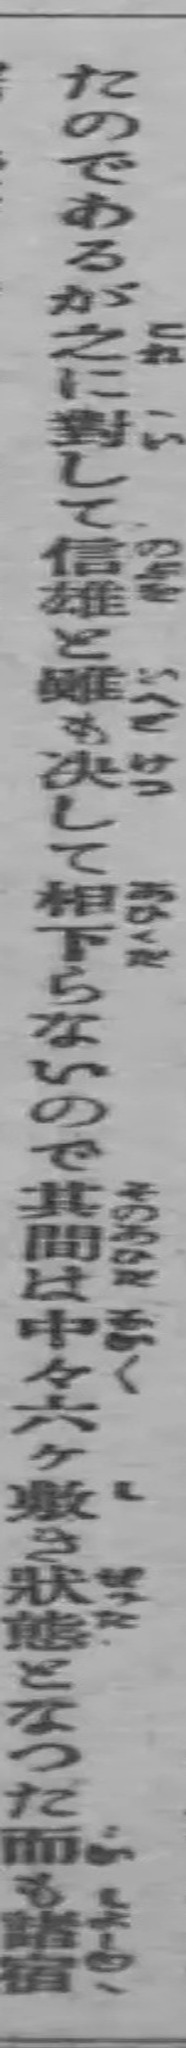たのであるが之に対して信雄と雖も決して相下らないので其間は中々六ケ敷き状態となつた而も諸宿
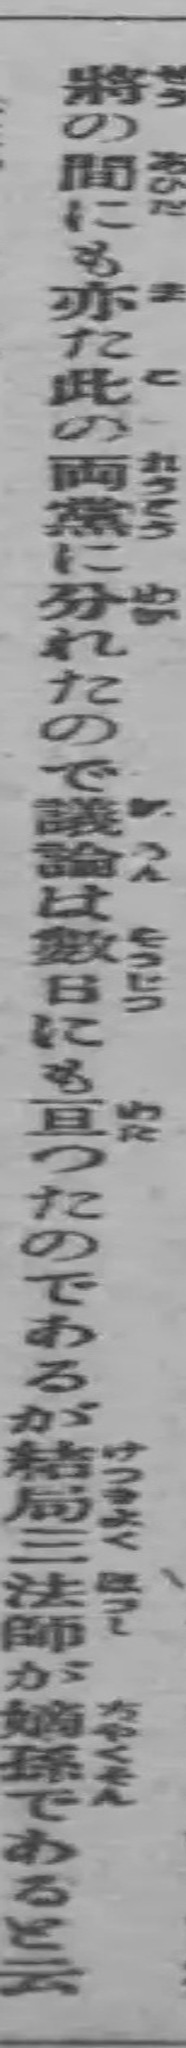将の間にもま亦た此の両党に分れたので議論は数日にも亘つたのであるが結局三法師が嫡孫であると云
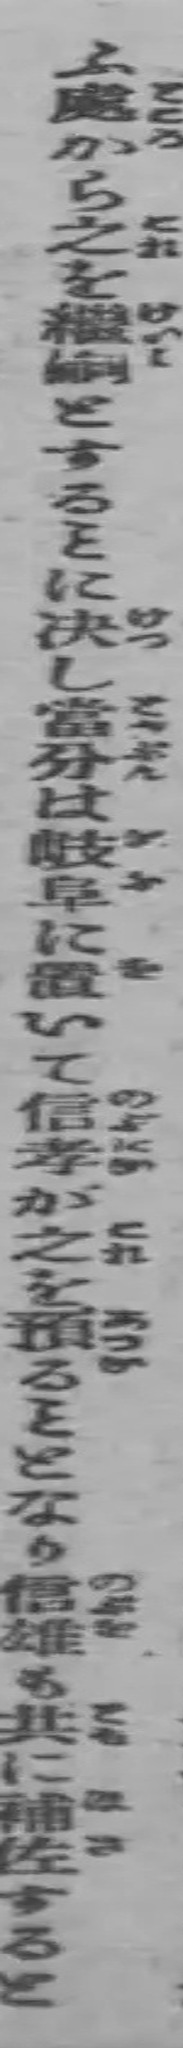ふ処から之を継嗣とすることに決し当分は岐阜に置いて信孝が之を預ることとなり信雄も共に補佐すると
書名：豊橋市史談
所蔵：国立国会図書館 National Diet Library, JAPAN
